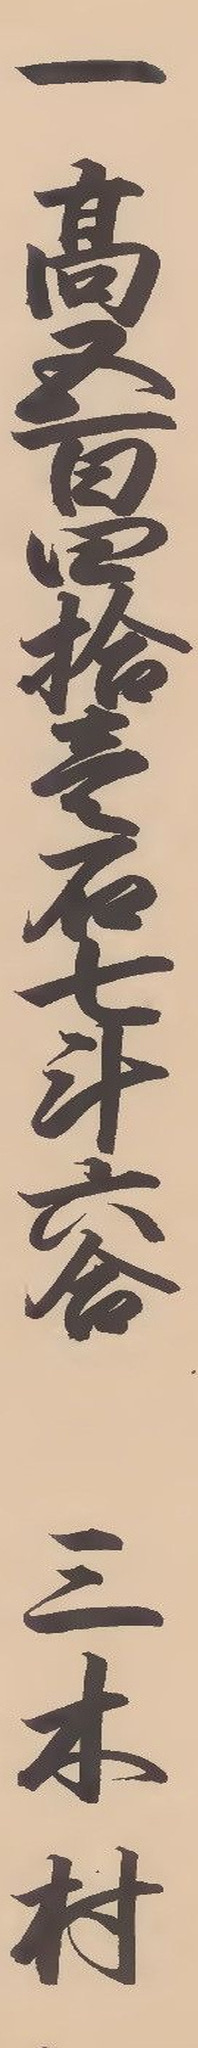一高五百四拾壱石七斗六合三木村
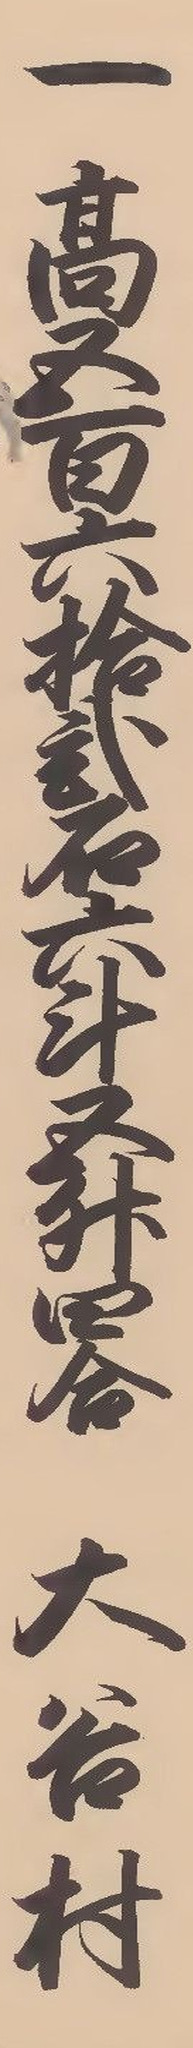一高五百六拾弐石六斗五升四合大谷村

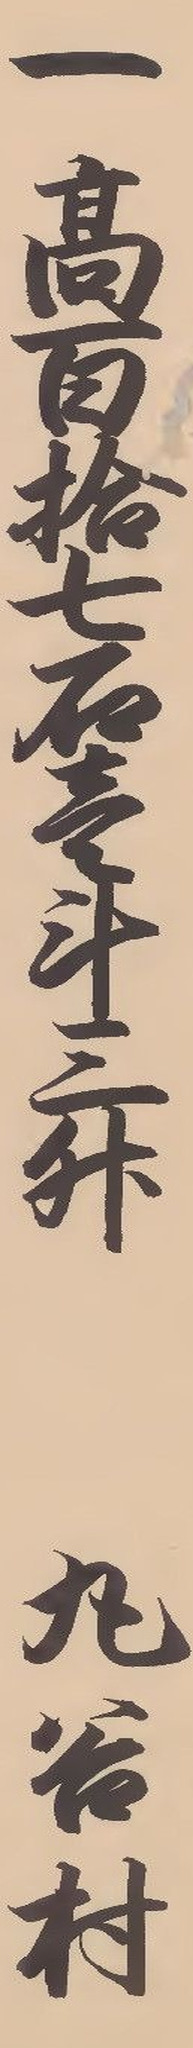一高百拾七石壱斗三升丸谷村
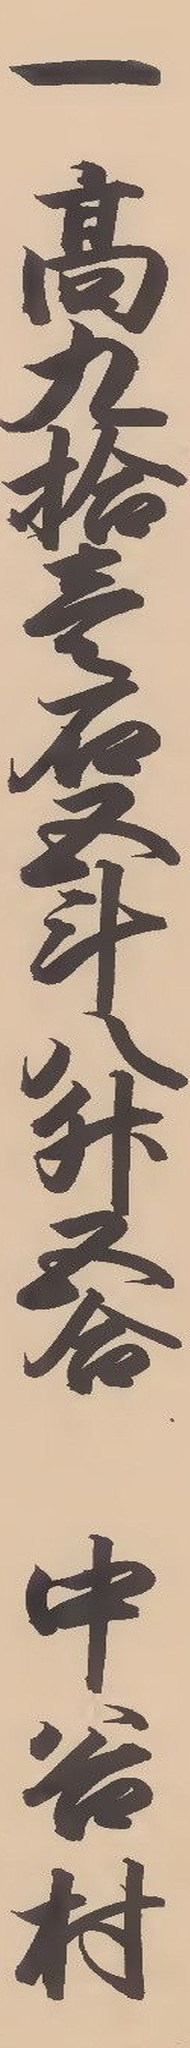一高九拾壱石五斗八升五合中谷村
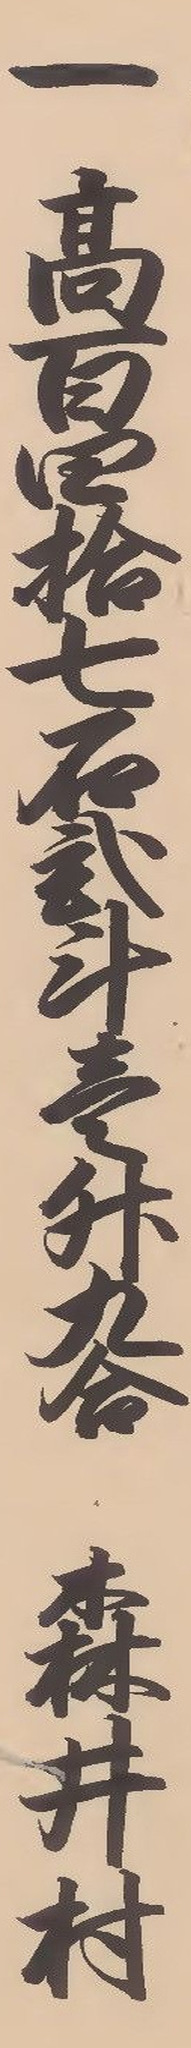一高百四拾七石弐斗壱升九合森井村
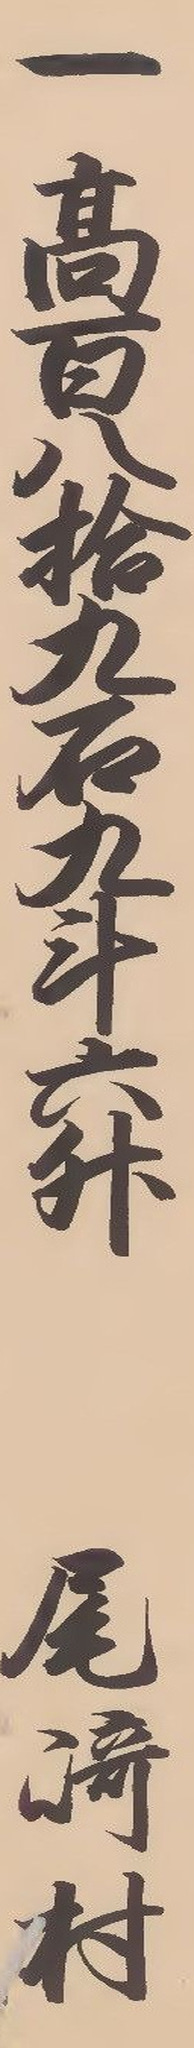一高百八拾九石九斗六升尾崎村
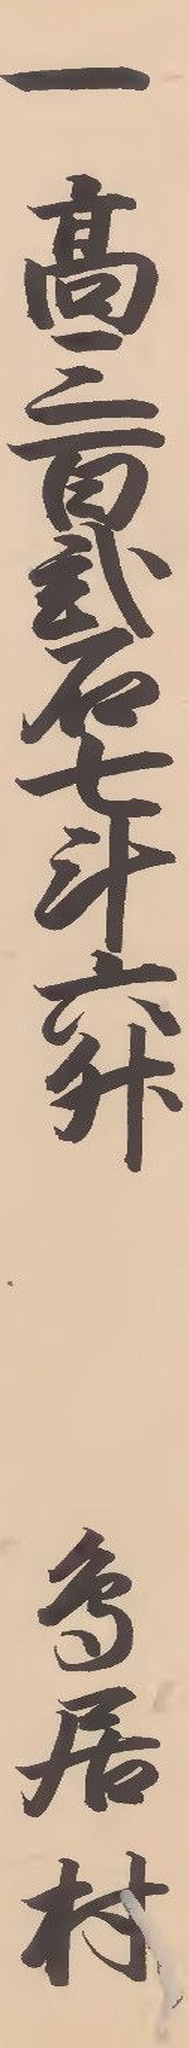一高三百弐石七斗六升鳥居村
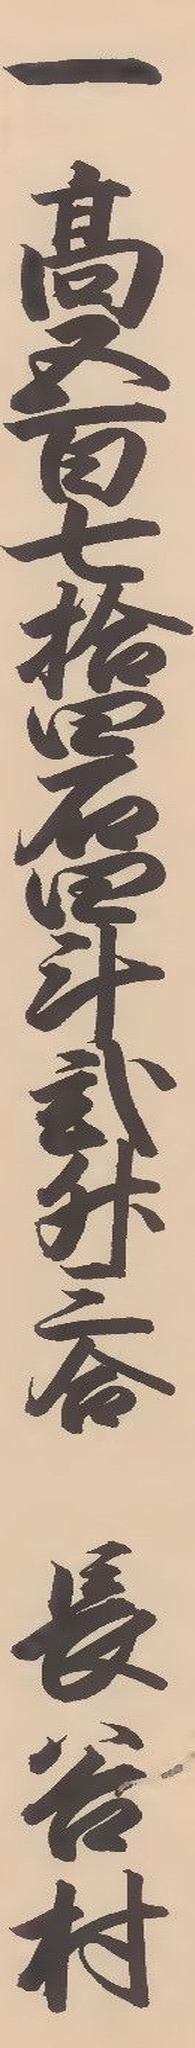一高五百七拾四石四斗弐升三合長谷村
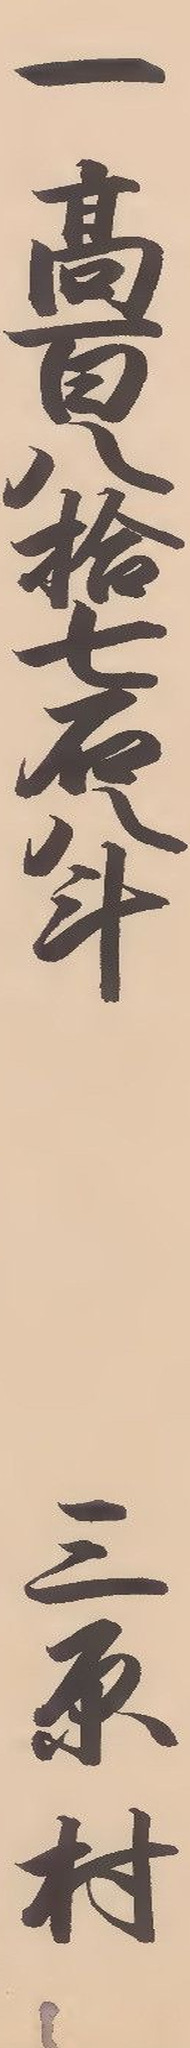一高百八拾七石八升三原村
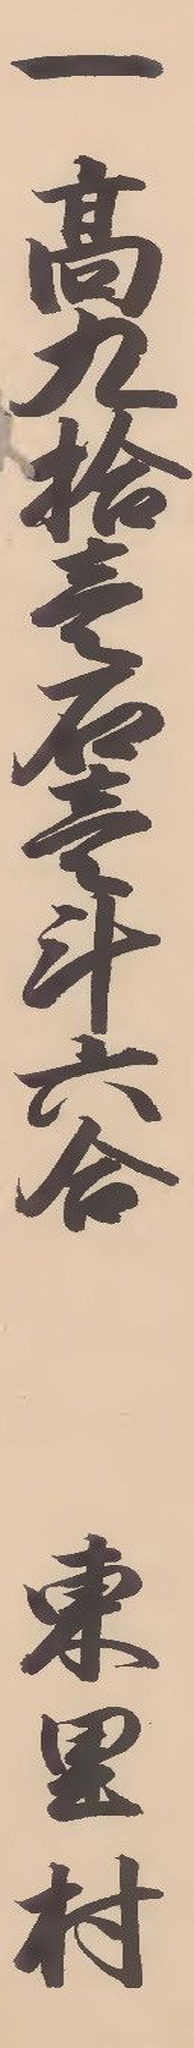一高九拾壱石壱斗六合東里村

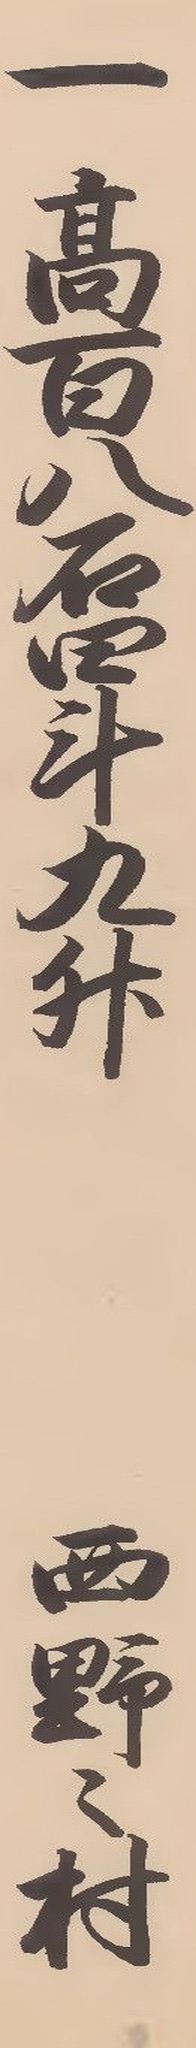一高百八石四斗九升西野々村
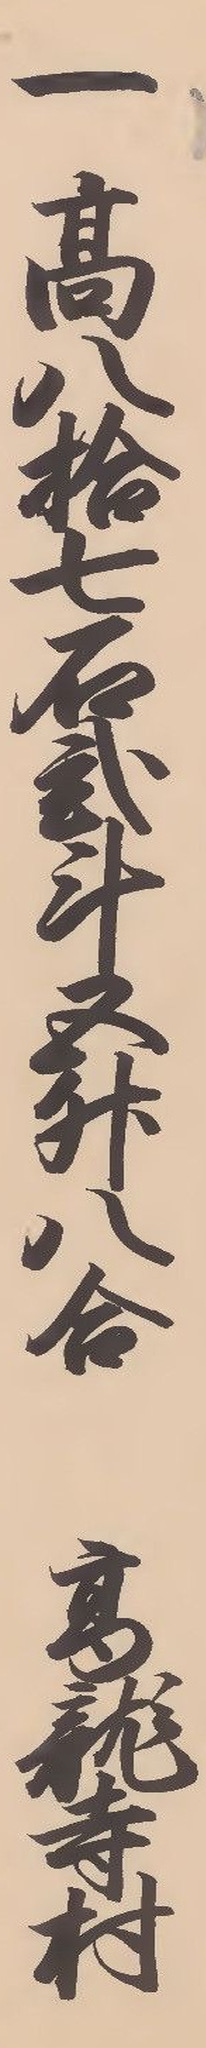一高八拾七石弐斗五升八合高龍寺村
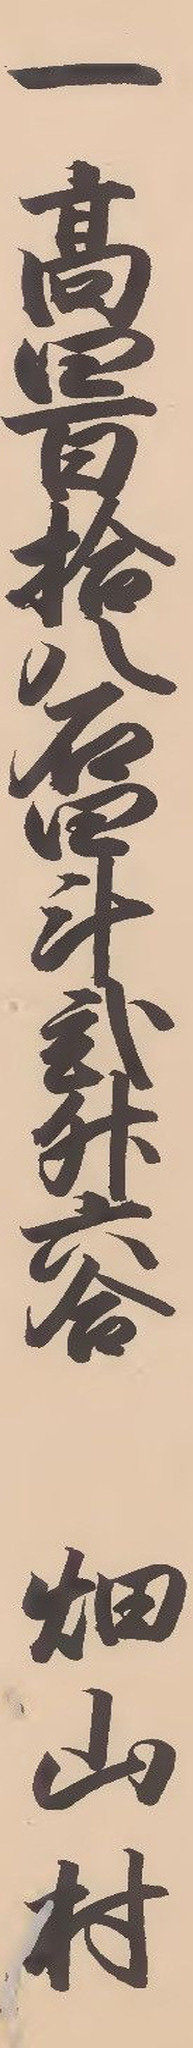一高四百拾八石四斗弐升六合畑山村
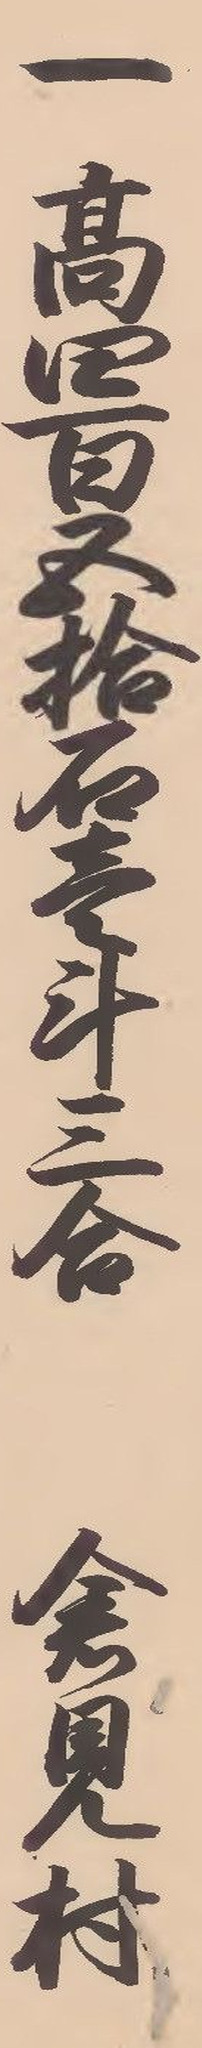一高四百五拾石壱斗三合倉見村
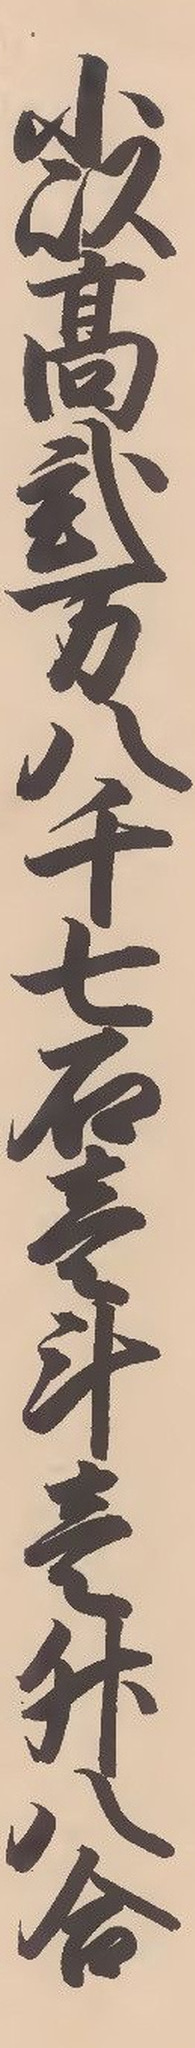小以高弐万八千七石壱斗壱升八合
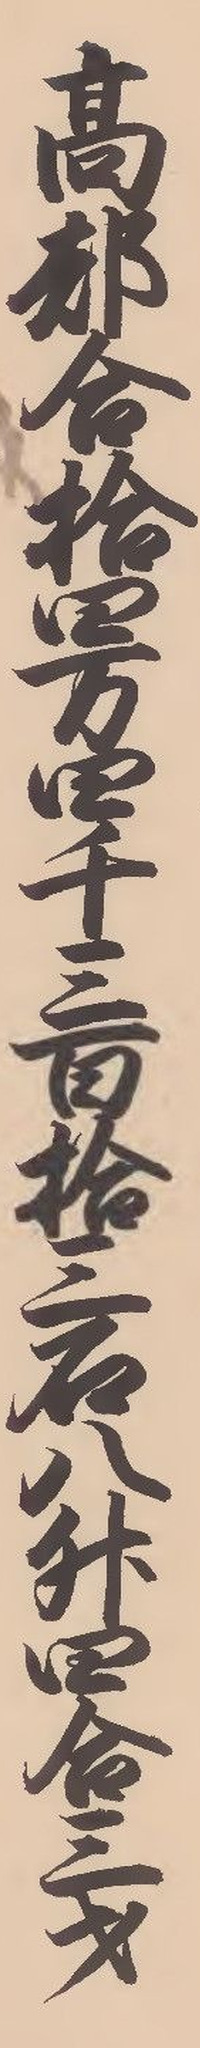高都合拾四万四千三百拾三石八斗四合三才
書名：但馬国郷帳
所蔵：国立公文書館 National Archives of Japan
